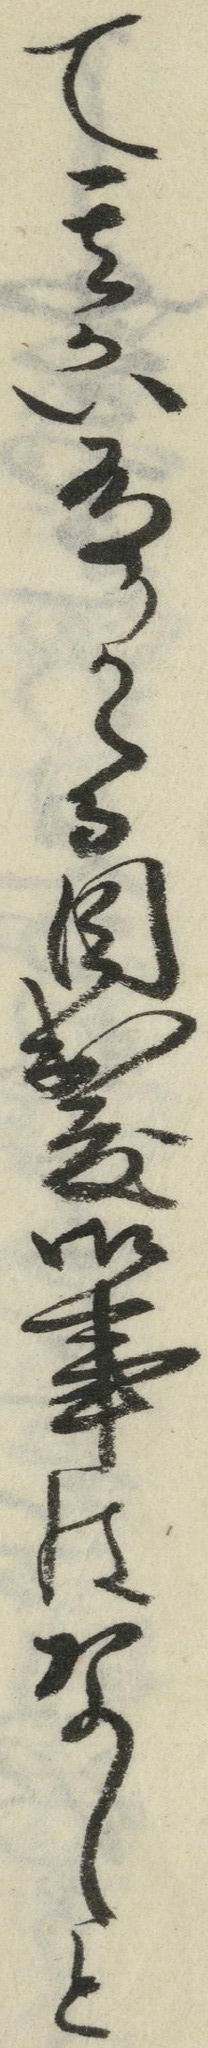て其かい有りかゝる目出度御事はなしと
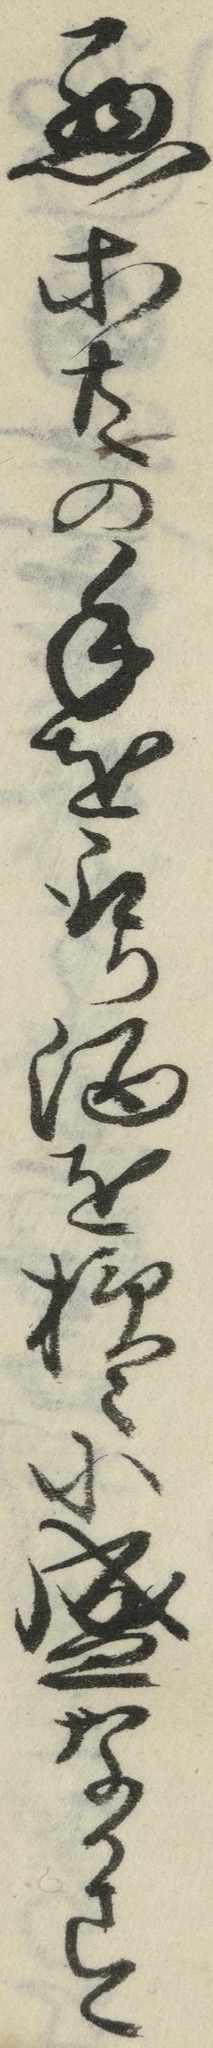悪等共の手を取り酒を様〻に盛なかす
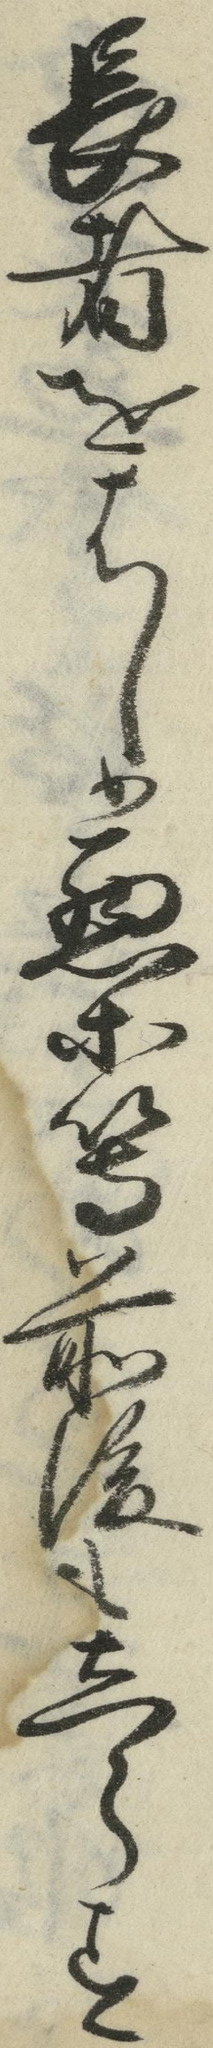長者をはしめ悪等等前後もしらす
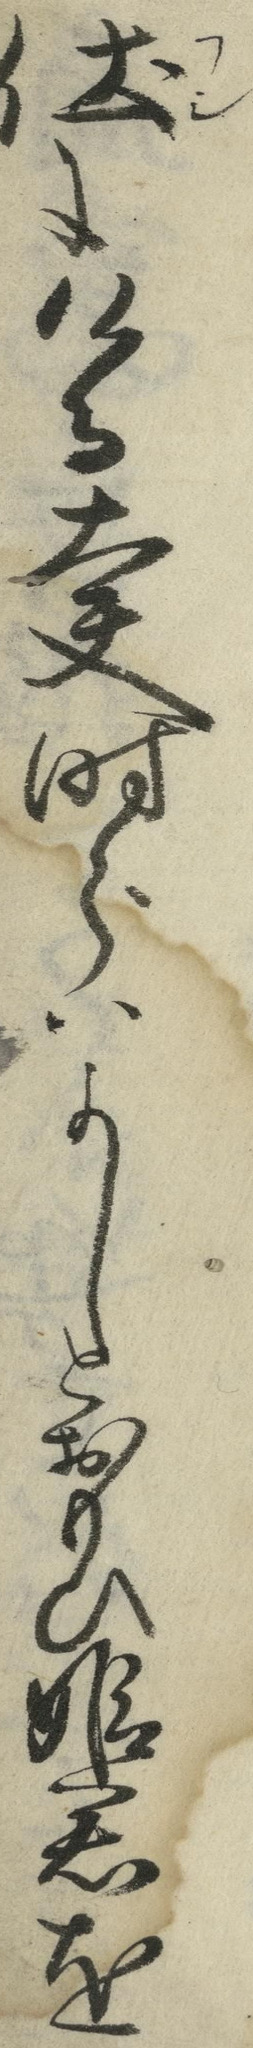伏にける大夫時分はよしとおもひ姫君を

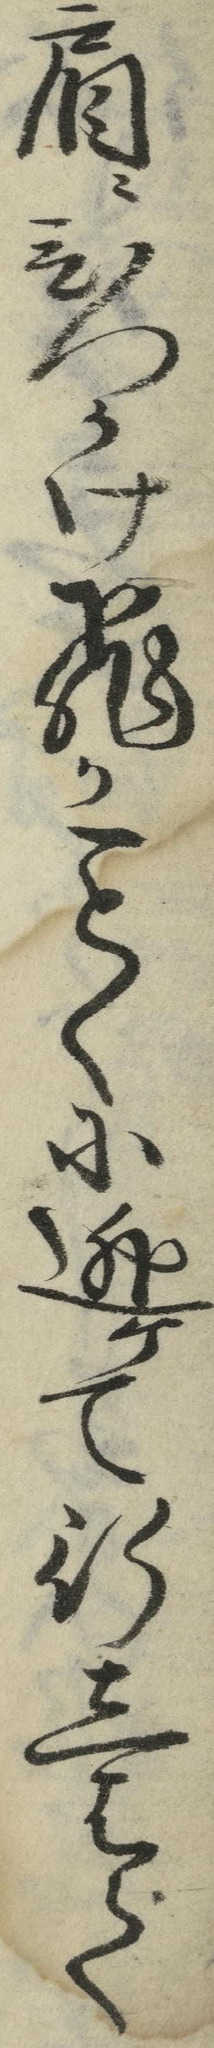肩ニひつかけ飛かことくに逃ケて行しはらく
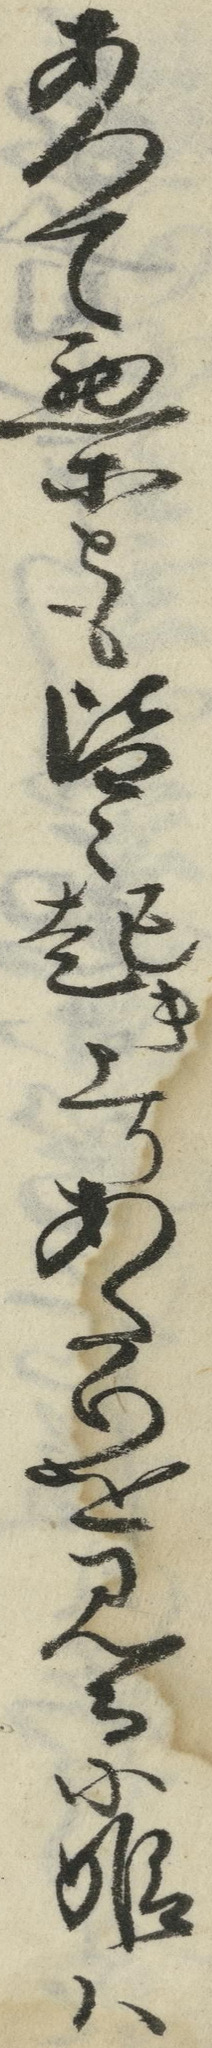あつて悪等とも皆〻起キ上リあたりを見るに姫ハ
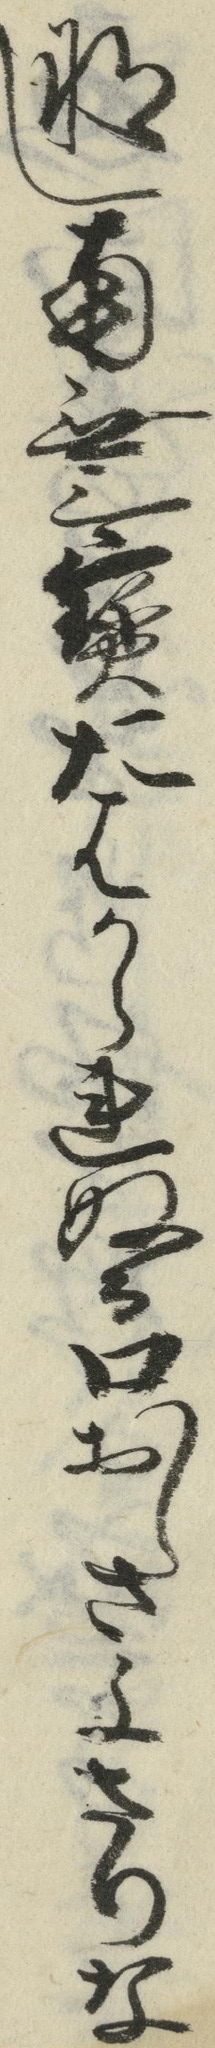なし南無三寶たはかられぬる口おしさよさりな
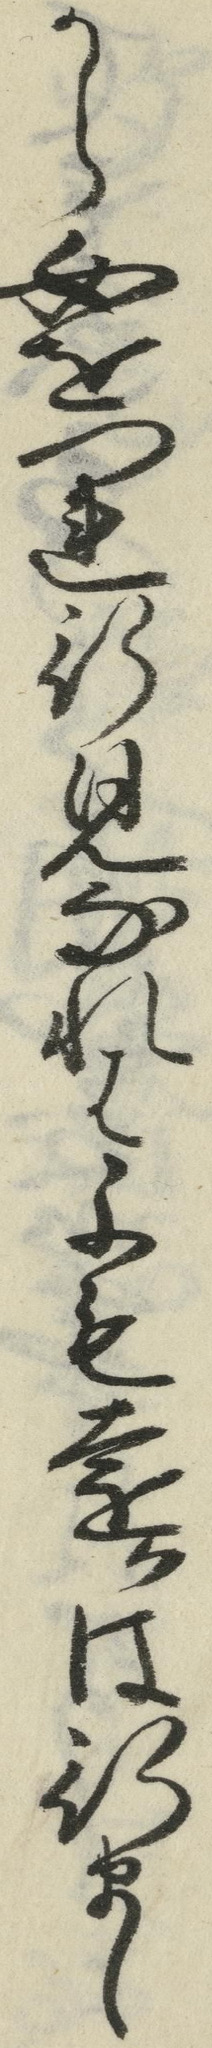から女をつれ行見なれはよも遠クは行まし
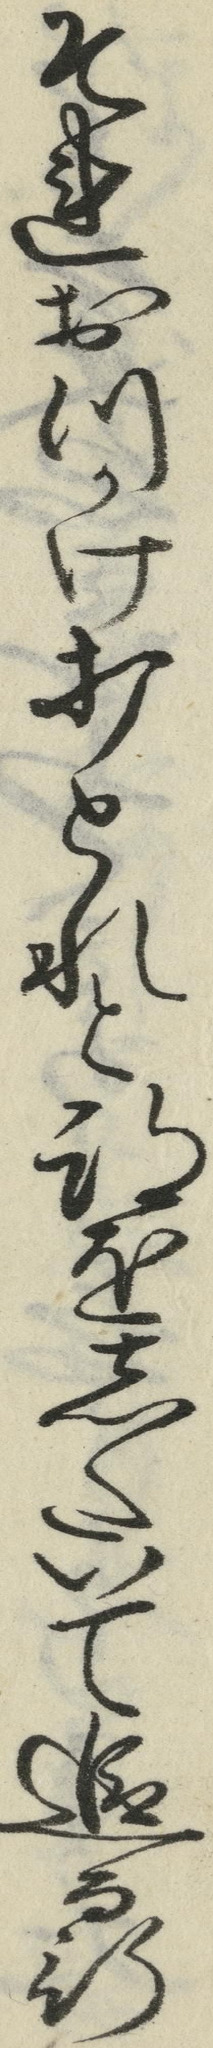それおつかけ打とれと跡をしたいて追而行
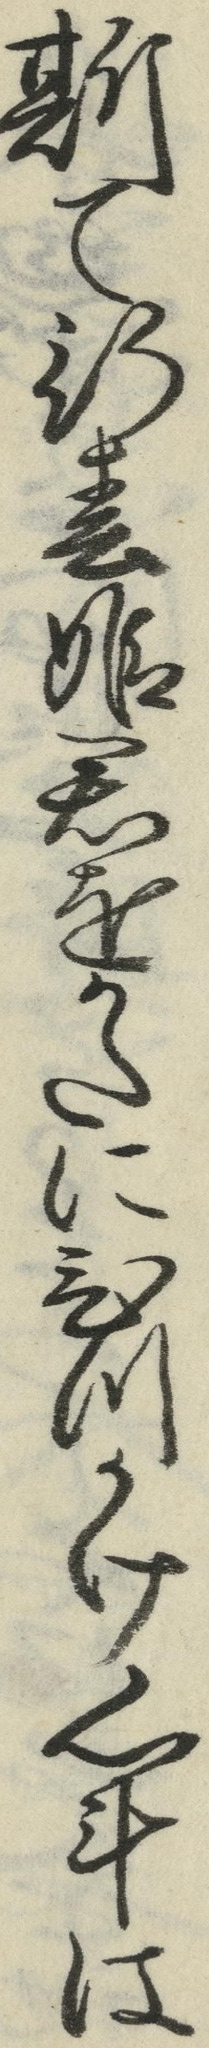斯て行春姫君をかたにひつかけ心斗は
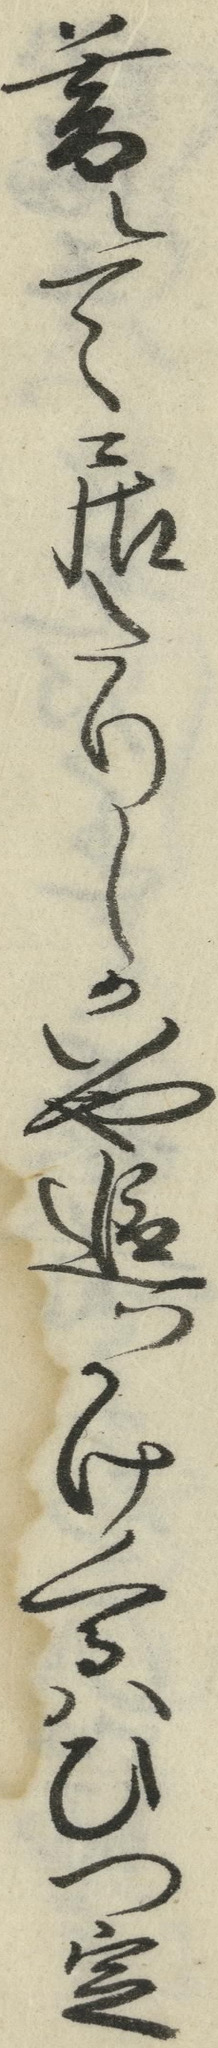暮レて居たりしかいや追つかけくるハひつ定
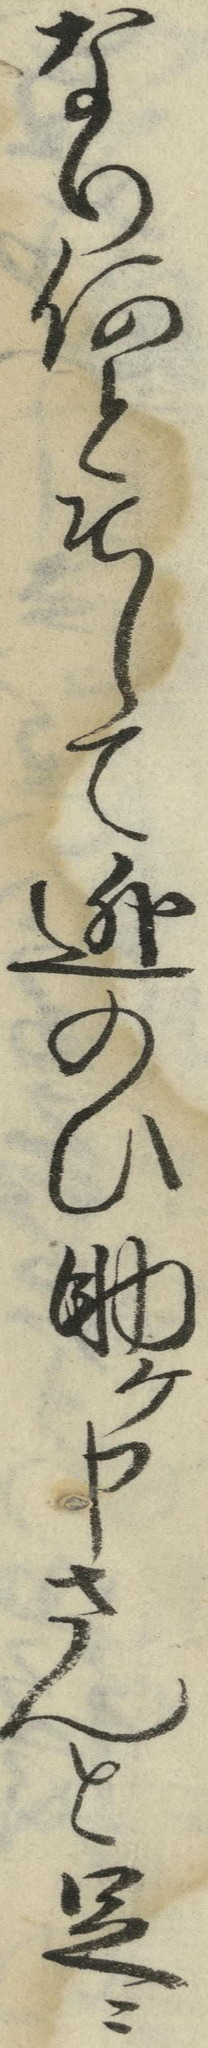なり何とそして逃のひ助ケ申さんと足ニ
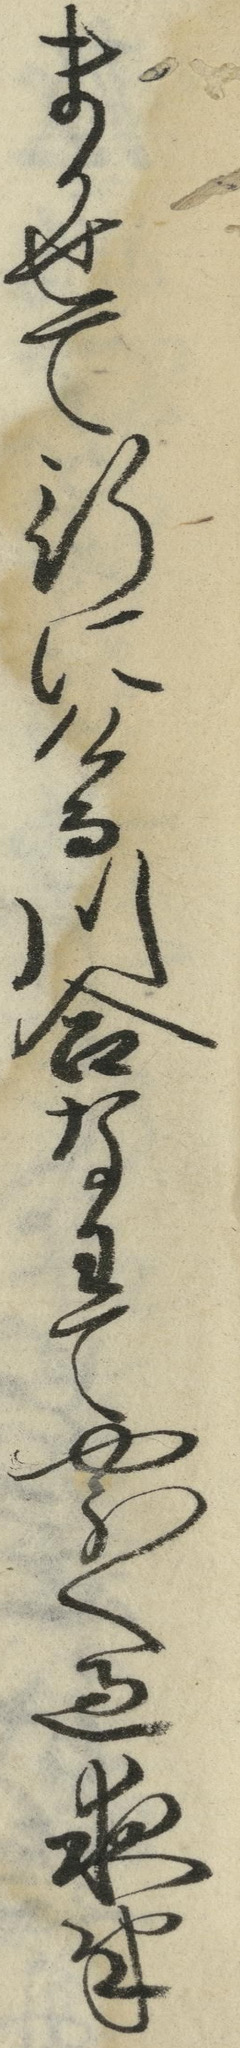まかせて行にける川合なわてやう〳〵過夜半
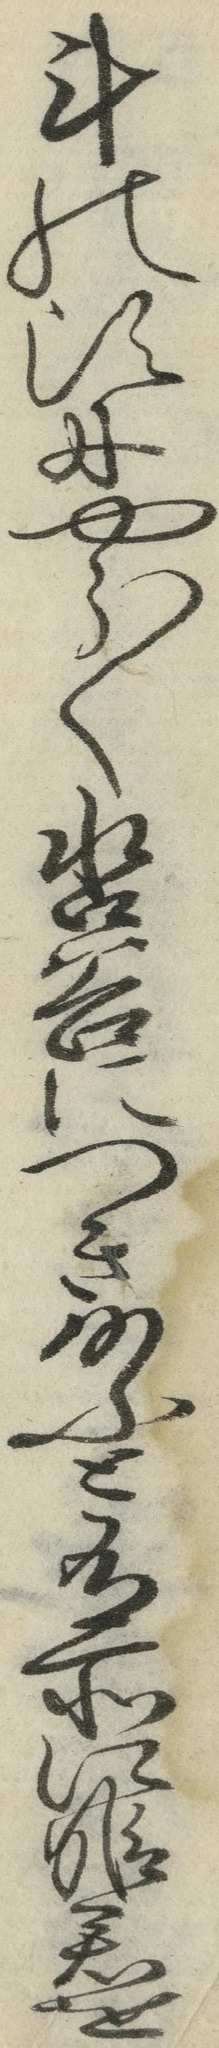斗の頃にやう〳〵沓谷つき給ふと有所え姫君を
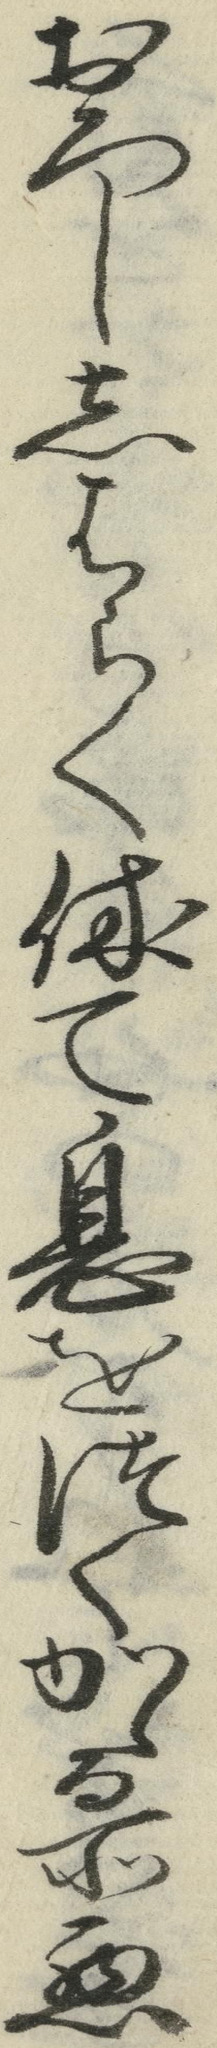おろししはらく休て息をつくかゝる所悪
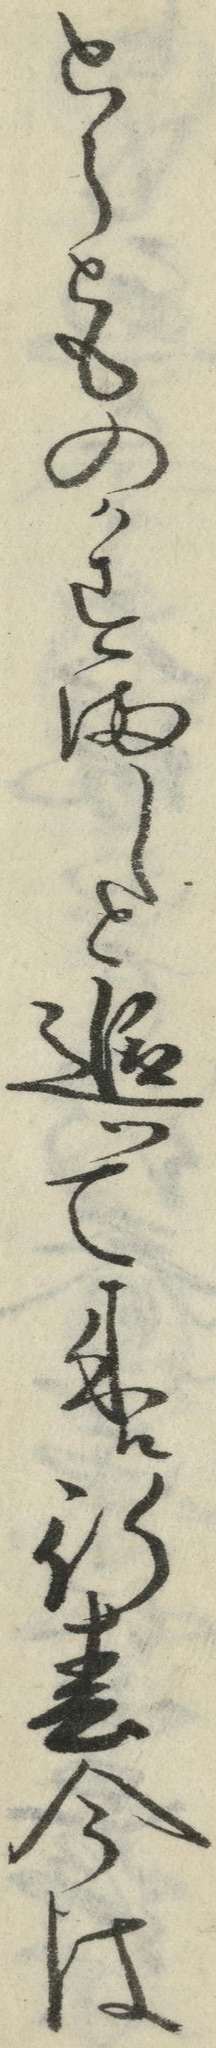とうとものかすましと追ッて来ル行春今は
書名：浅間記
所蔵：東京大学地震研究所図書室 Earthquake Research Institute Library, The University of Tokyo, JAPAN
